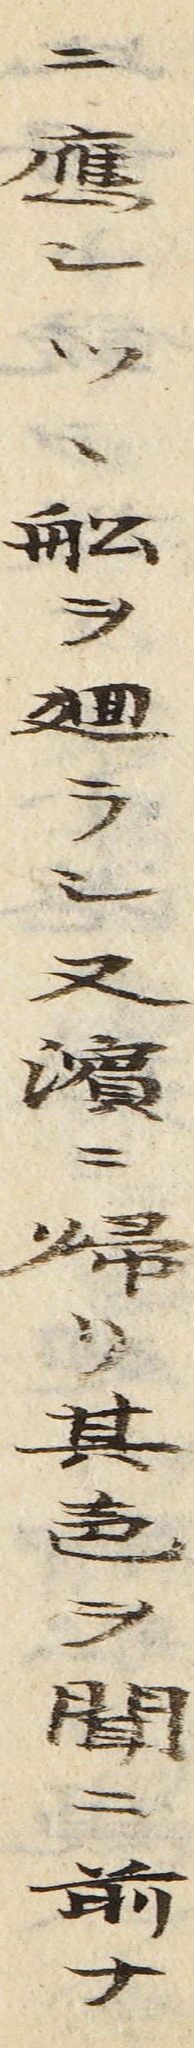ニ応シツヽ船ヲ廻ラシ又浜ニ帰リ其声ヲ聞ニ前ナ
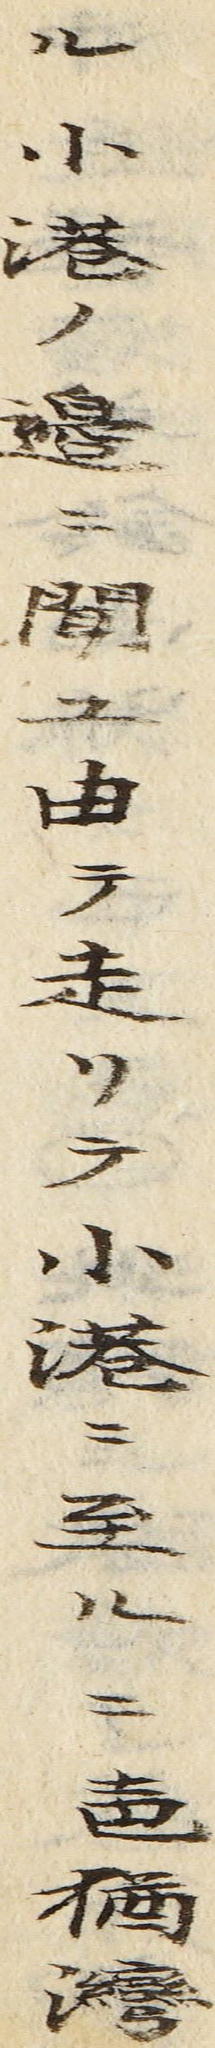ル小港ノ辺ニ聞ユ由テ走リテ小港ニ至ルニ声猶湾
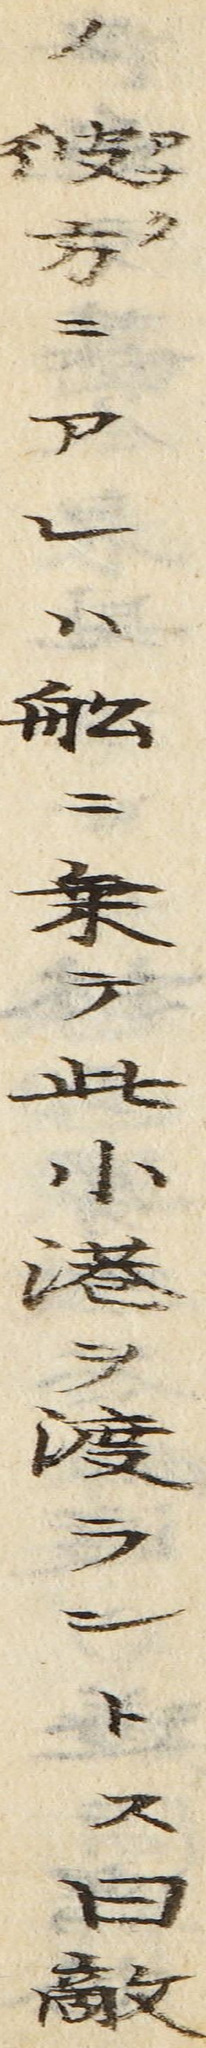ノ彼方ニアレハ船ニ乗テ此小港ヲ渡ラントス曰敵
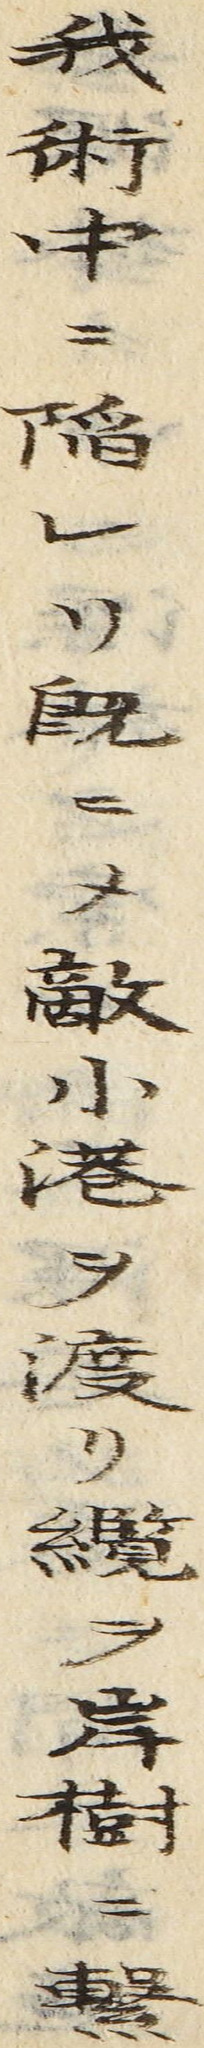我術中ニ陥レリ既ニシテ敵小港ヲ渡リ纜ヲ岸樹ニ繋
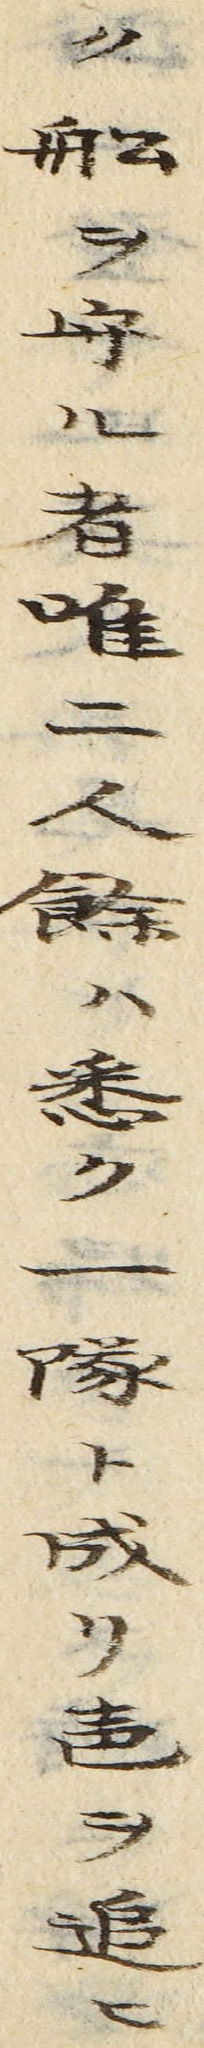ク船ヲ守ル者唯二人余ハ悉ク一隊ト成リ声ヲ追ヒ

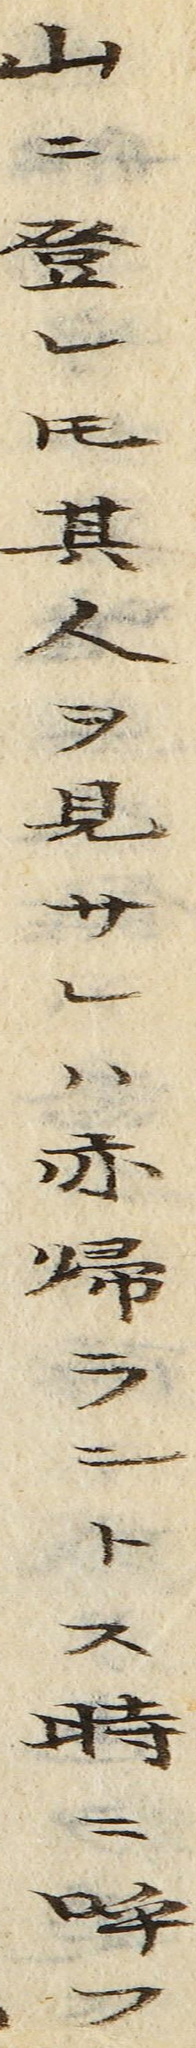山ニ登レトモ其人ヲ見サレハ亦帰ラントス時ニ呼フ
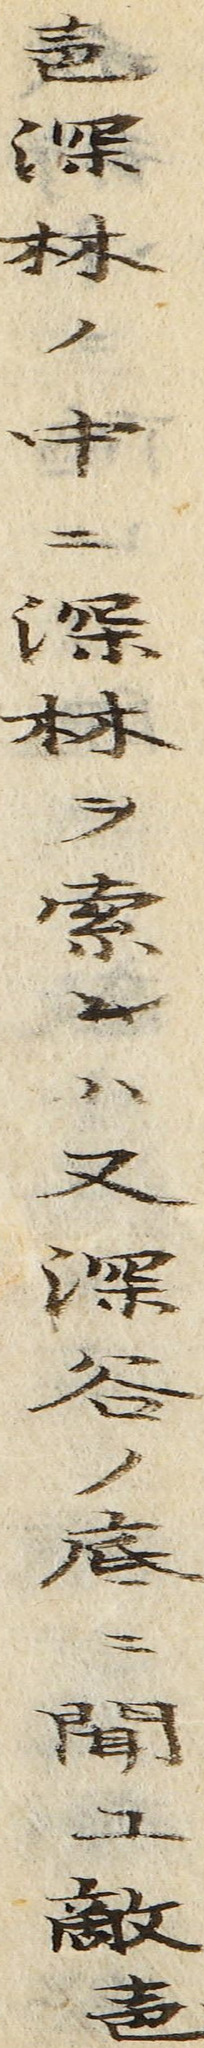声深林ノ中ニ深林ヲ索ンハ又深谷ノ底ニ聞ユ敵声
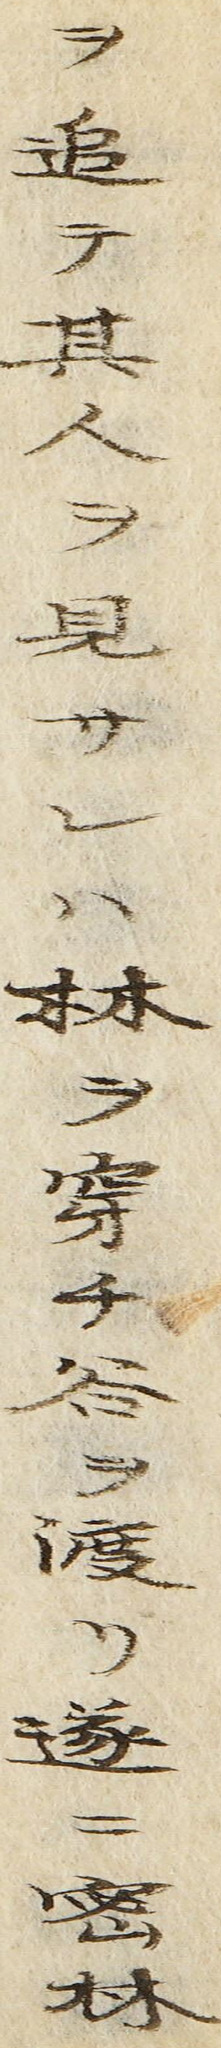ヲ追テ其人ヲ見サレハ林ヲ穿チ谷ヲ渡リ遂ニ密林
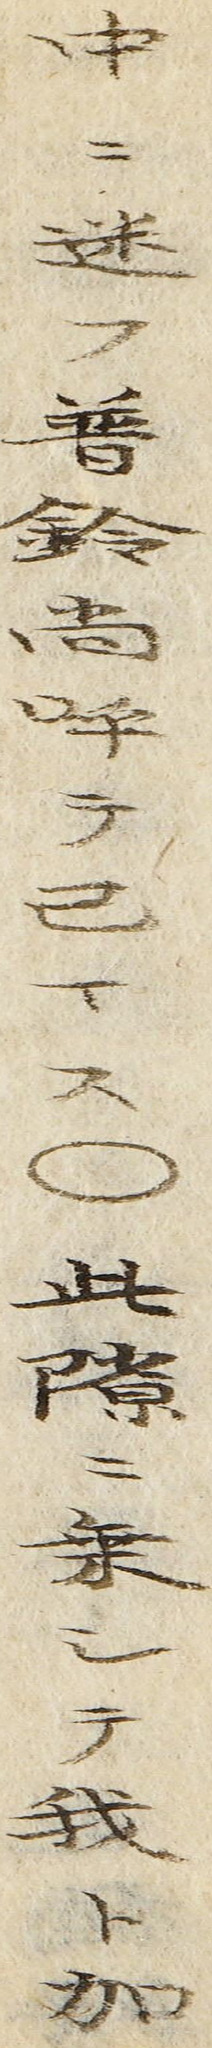中ニ迷フ普鈴尚呼テ已マス◯此隙ニ乗シテ我ト加
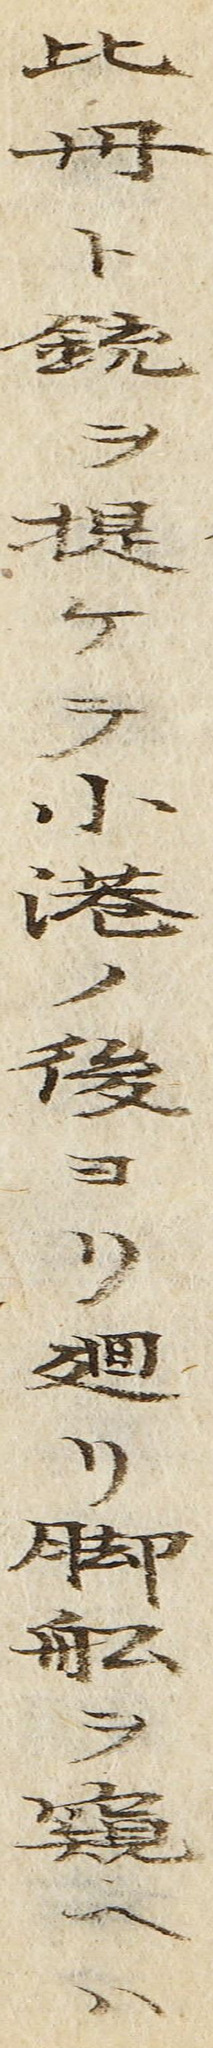比丹ト銃ヲ提ケテ小港ノ後ヨリ廻リ脚船ヲ窺ヘハ
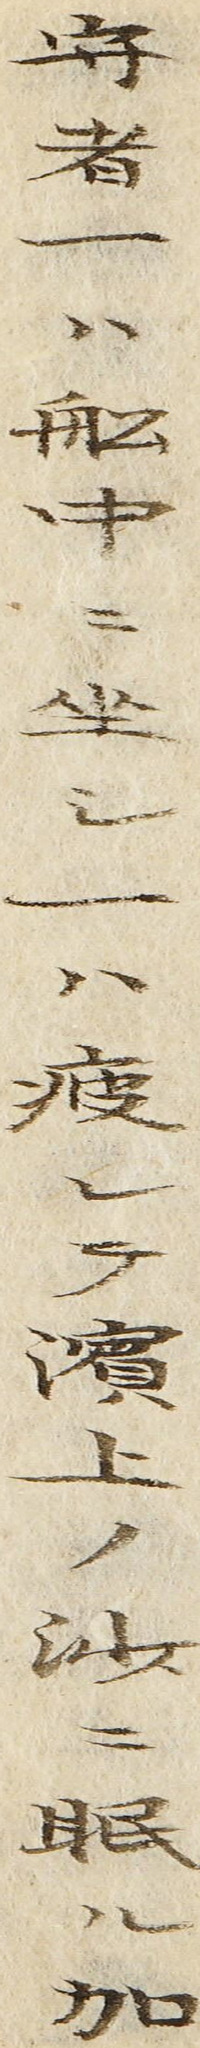守者一ハ船中ニ坐シ一ハ疲レテ浜上ノ沙ニ眠ル加
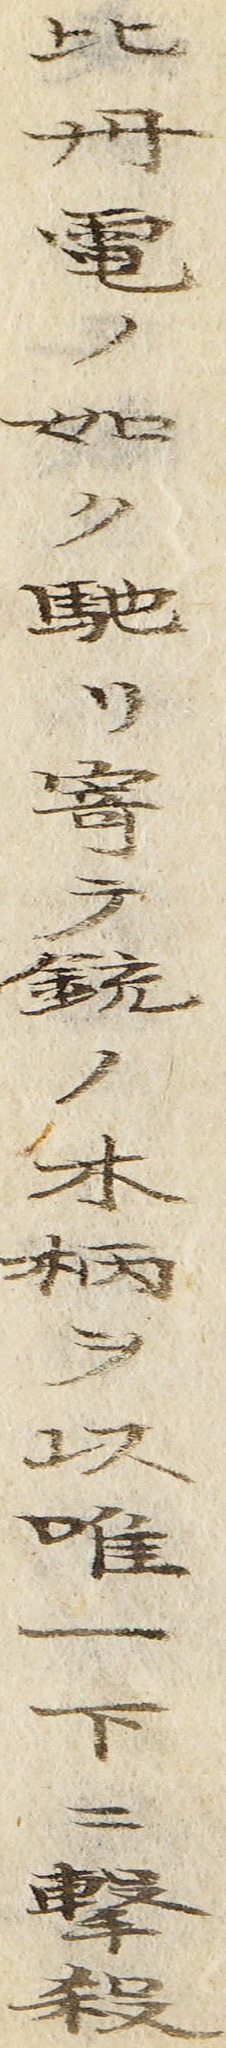比丹電ノ如ク馳リ寄テ銃ノ木柄ヲ以唯一下ニ撃殺
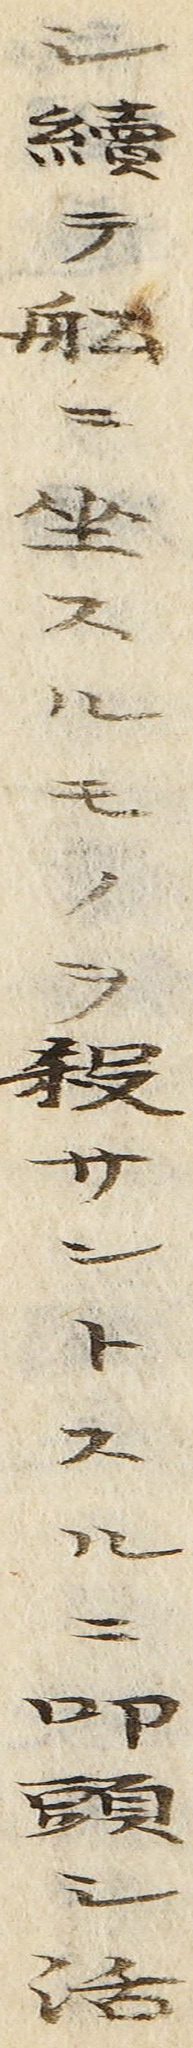シ続テ船ニ坐スルモノヲ殺サントスルニ叩頭シ活
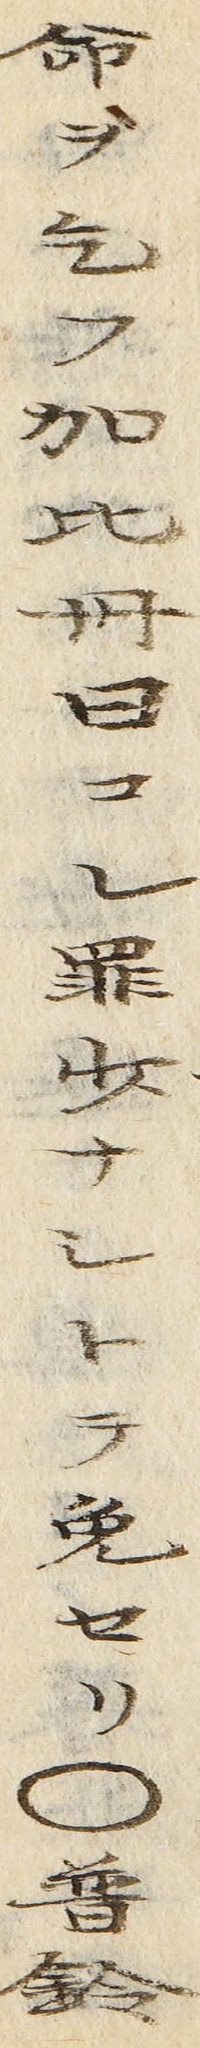命ヲ乞フ加比丹曰コレ罪少ナシトテ免セリ◯普鈴
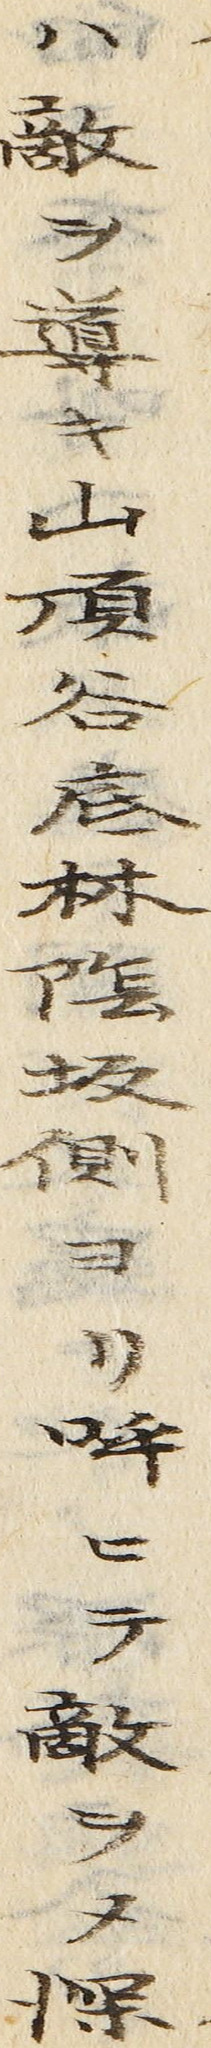ハ敵ヲ導キ山頂谷底林陰坂側ヨリ呼ヒテ敵ヲシテ深
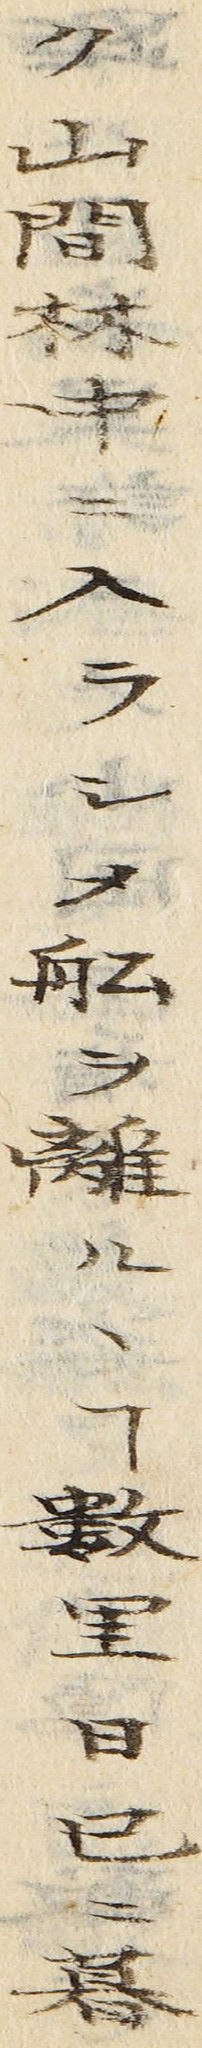ク山間林中ニ入ラシメ船ヲ離ルヽコト数里日已ニ暮
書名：漂流紀事
